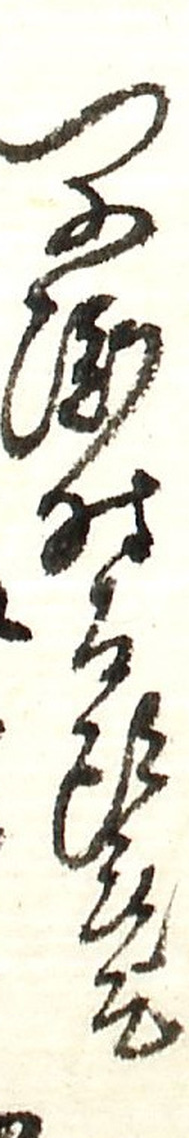早渕村与頭庄屋
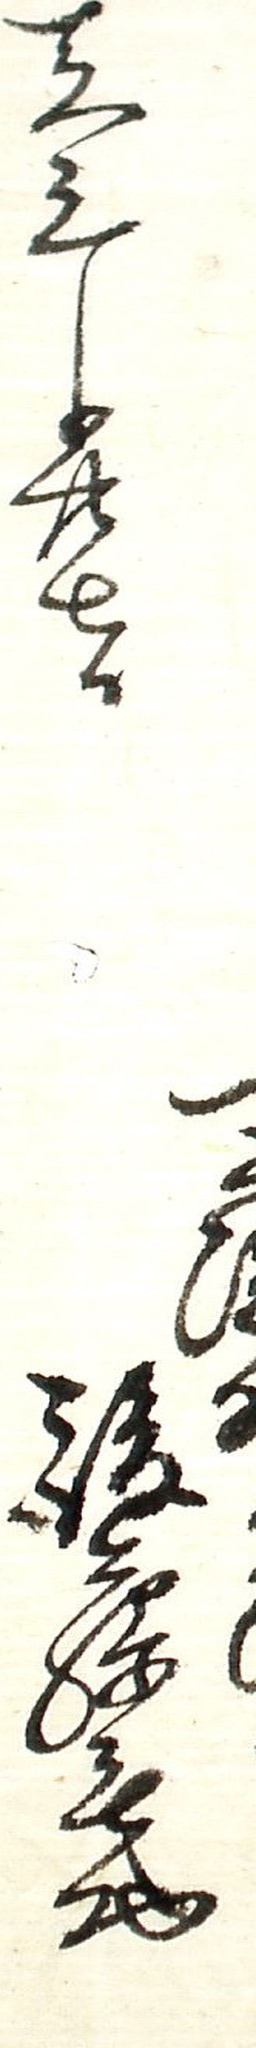亥三月廿七日後藤庄助
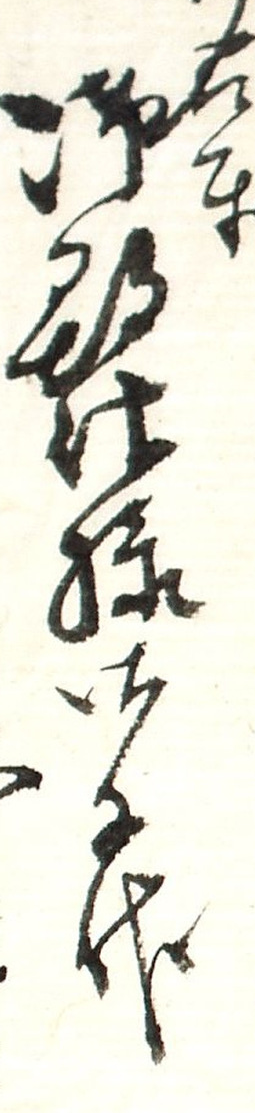御郡代様御手代
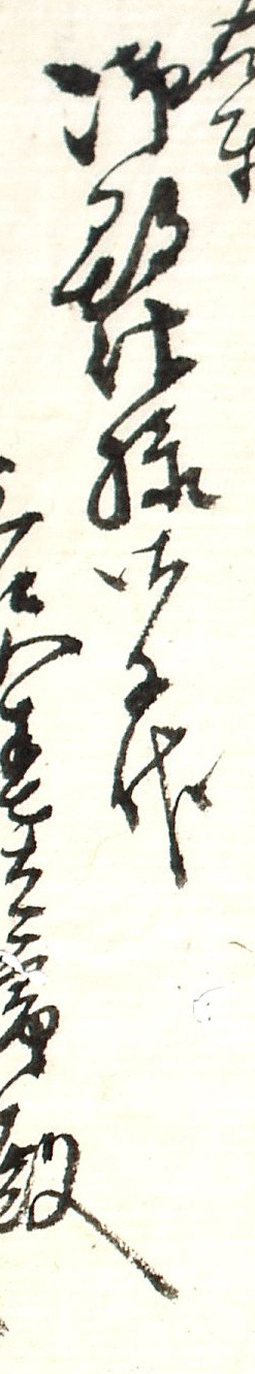御郡代様御手代
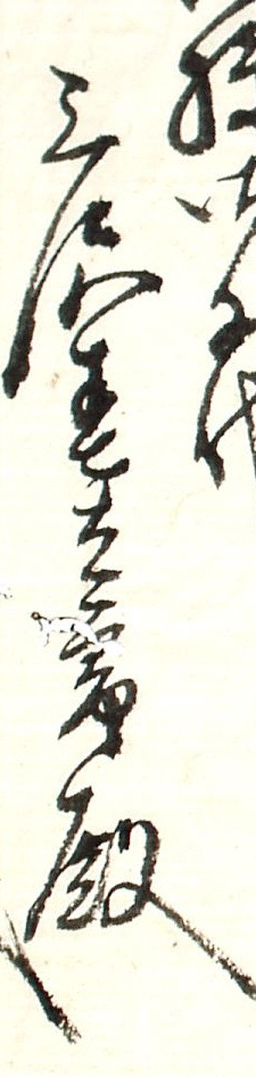三沢春太郎殿
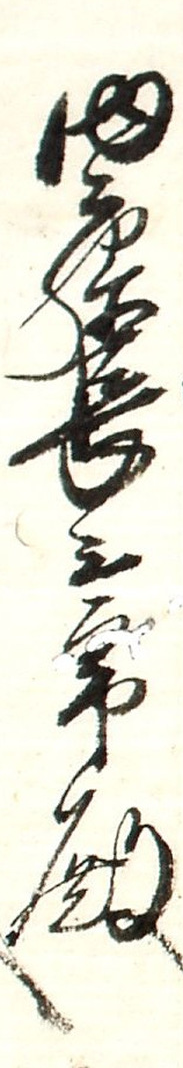内藤長三郎殿
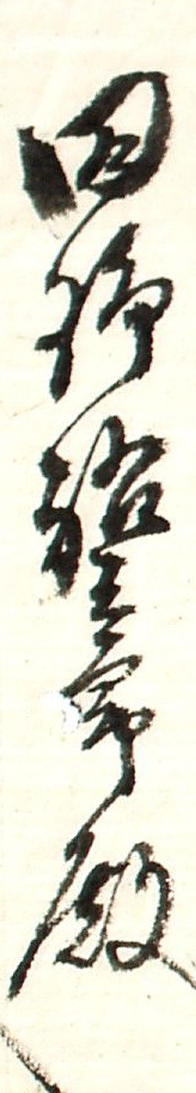田野祐太郎殿
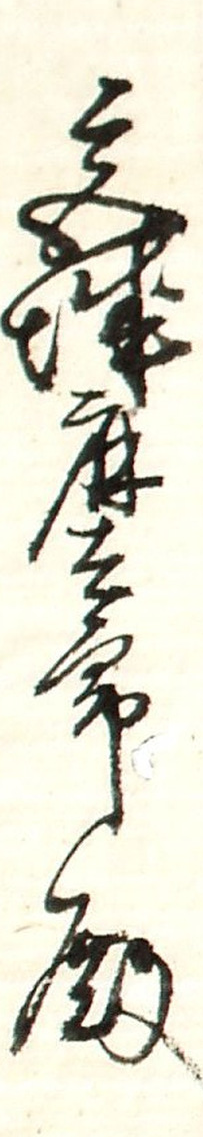宮城麻太郎殿

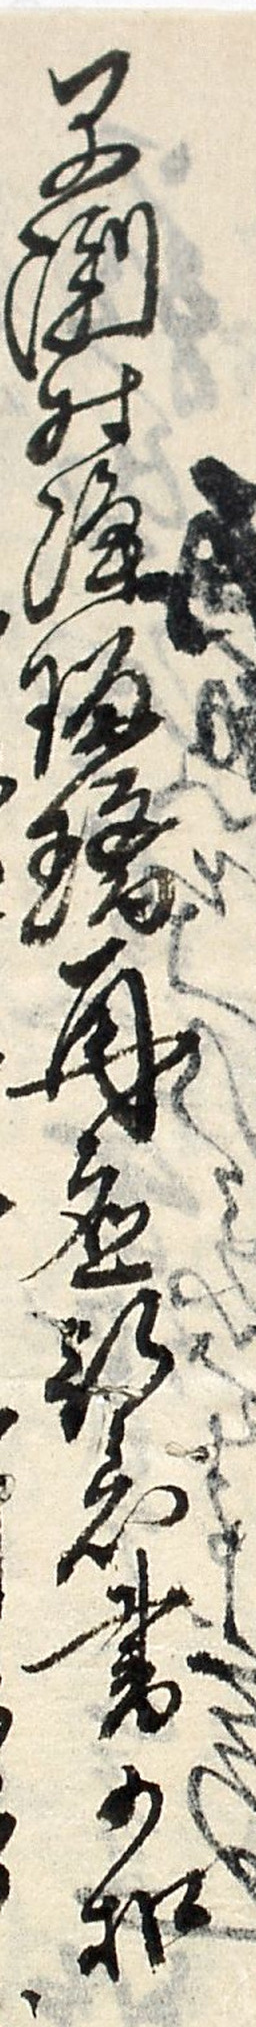早渕村浄瑠璃再應行着書の扣
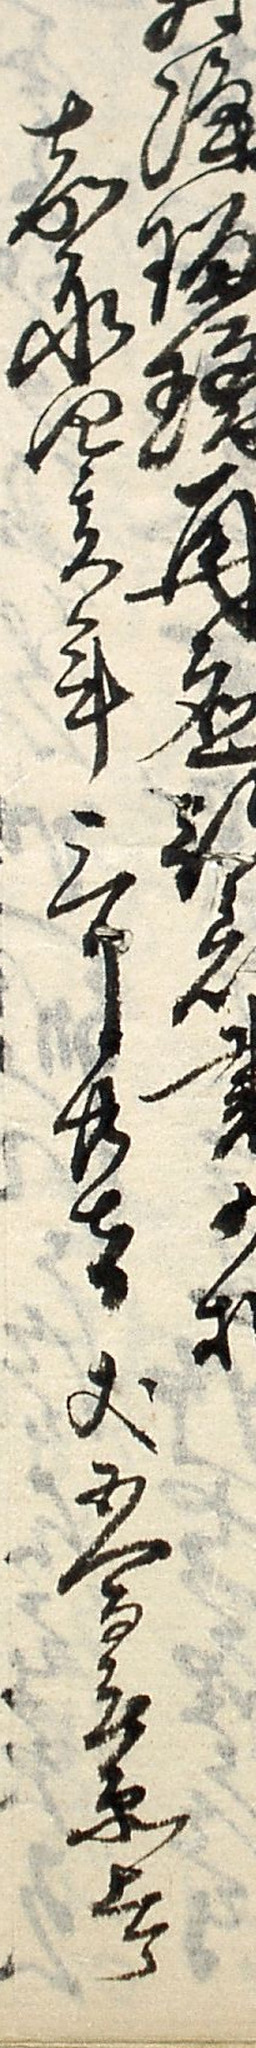嘉永四亥年三月廿七日丈五人与庄兵衛上候

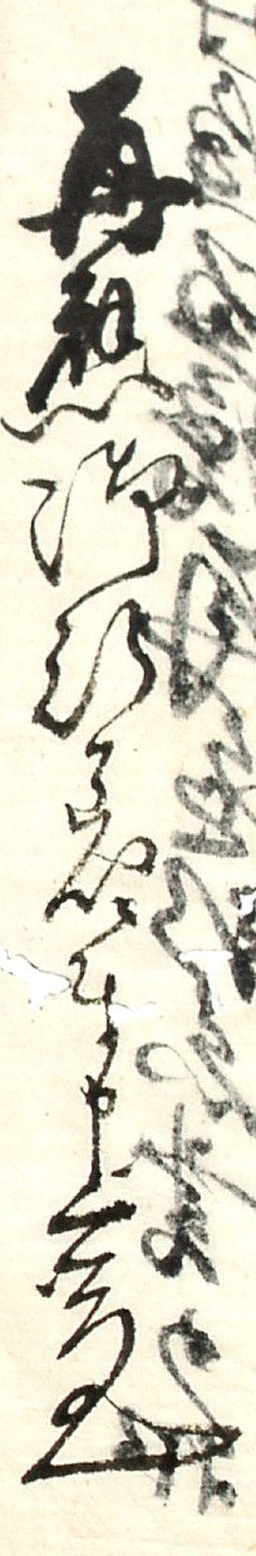再應御行着ニ奉申上覚
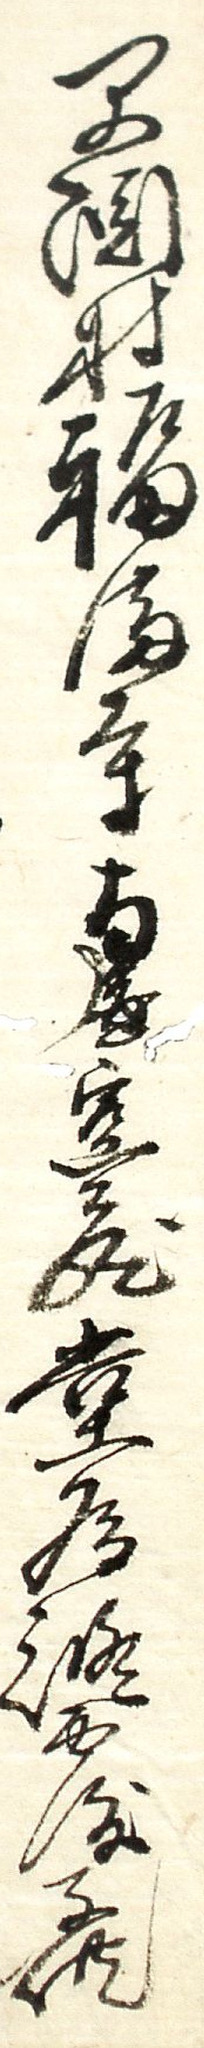早淵村福満寺南虚空蔵堂為修覆子供
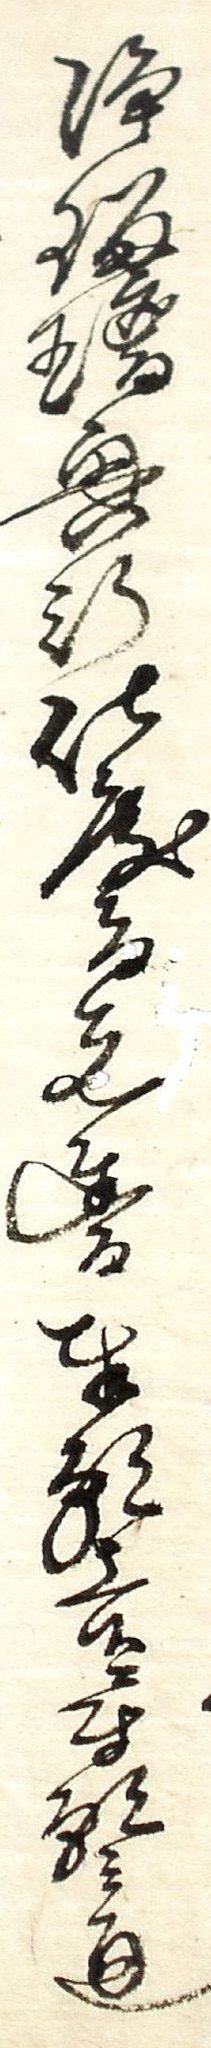浄瑠璃興行仕度旨先達而奉願上候ニ付願之通
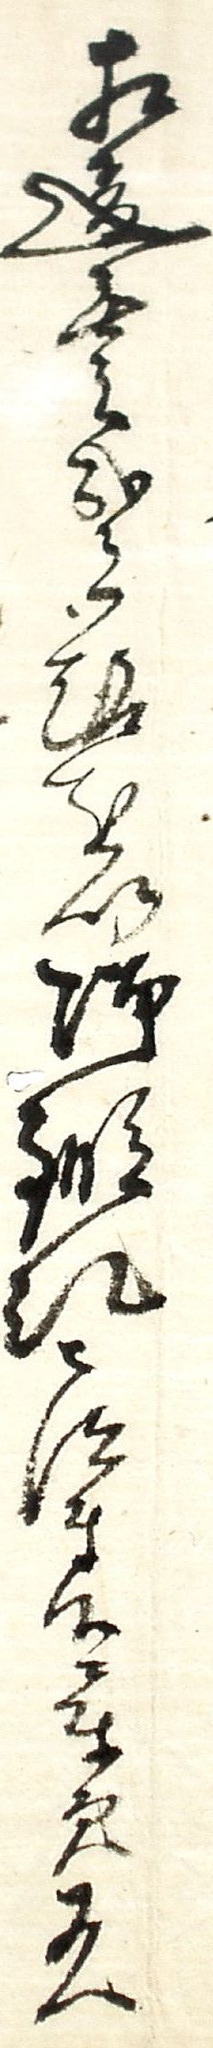相違無之哉之御趣を以御鍛糺被仰付候ニ付而ハ右
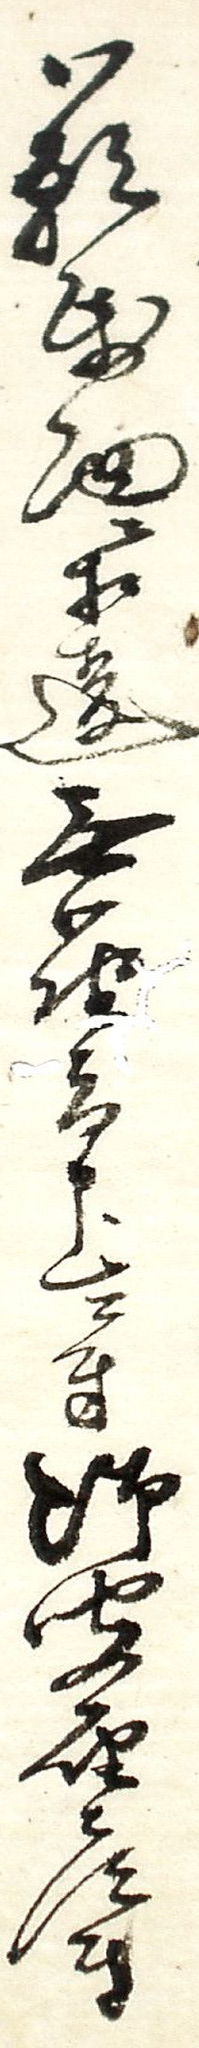御願帋面ニ相違無御座旨申上ニ付御聞届被仰付
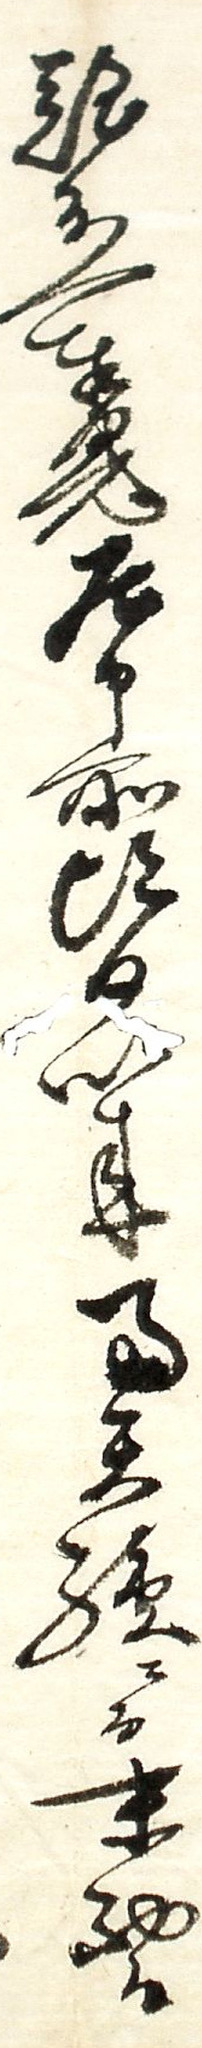難有奉畏居申所頃日以来雨天續ニ而未初而
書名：早渕村福満寺浄瑠璃再応行着添書ひかへ
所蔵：鳴門教育大学 Naruto University of Education
